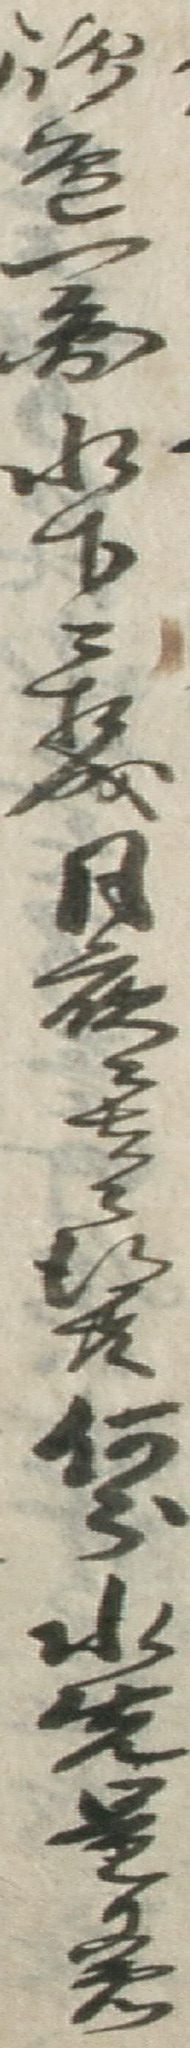嶋辺一円水下二相成月夜二は候得共何分水先量り兼
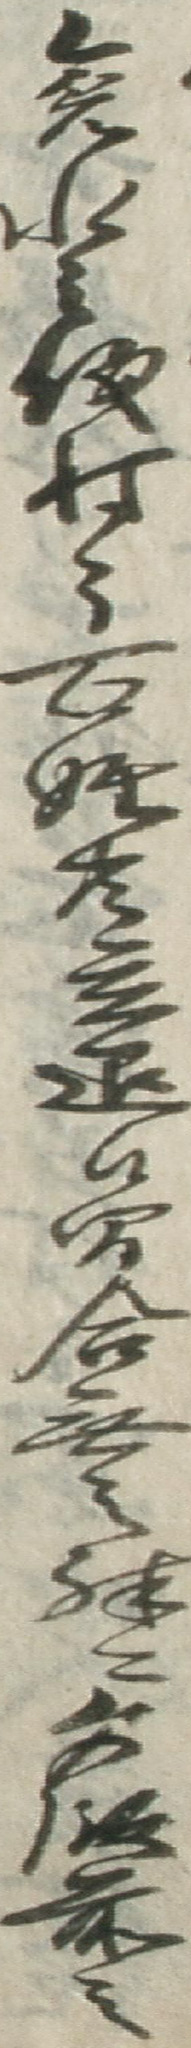急水之儀村々之百姓共立退候間合無之殊二夕飯前之
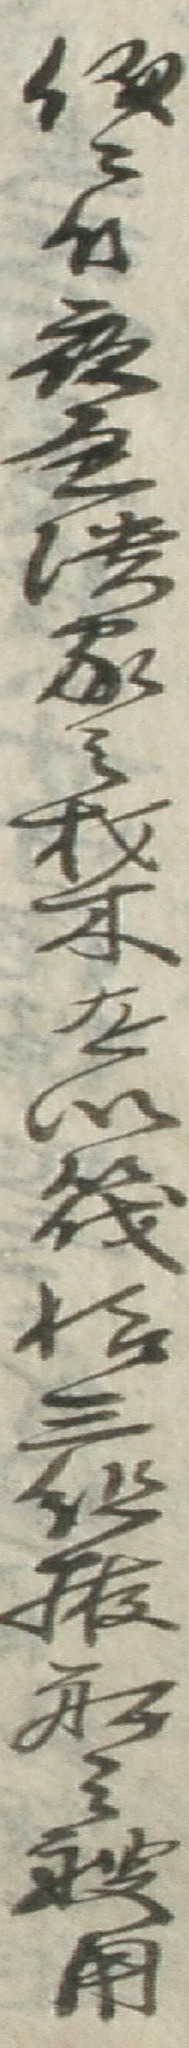儀二付夜通潰家之木材木を以筏様三組拵船三艘用
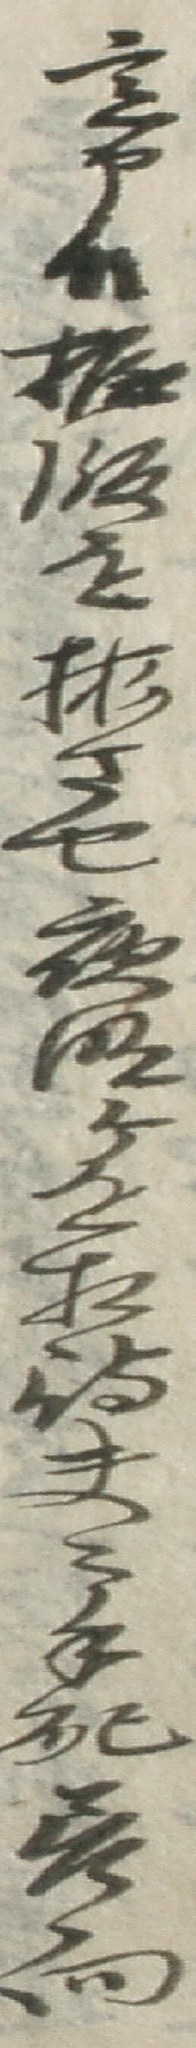意申付携飯を拵させ夜明ヶを相待夫々手配差向
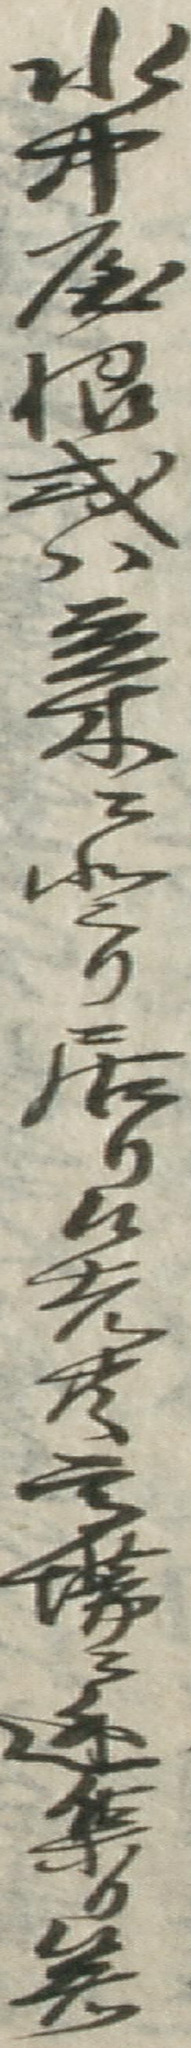水中屋根或ハ立木二登り居候者共高場二逃集り候者
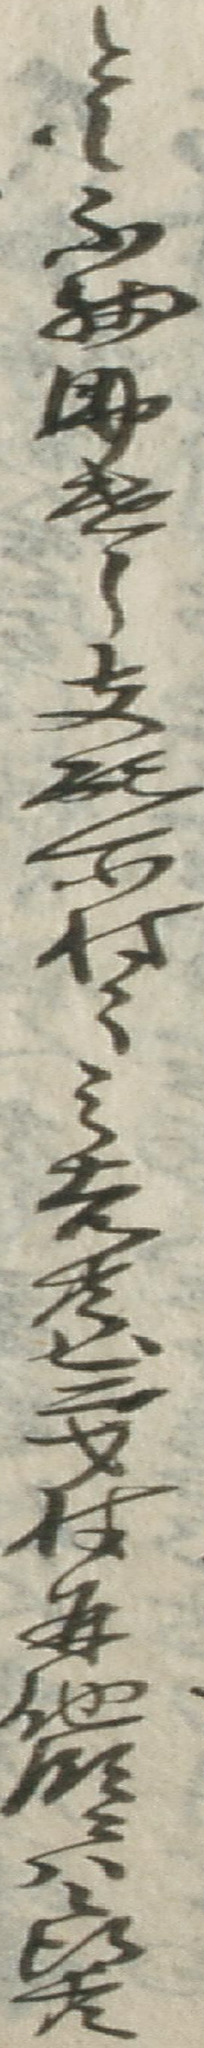とも不残助遣し支配所村々之者共ハ三才村并他領二ハ候得共
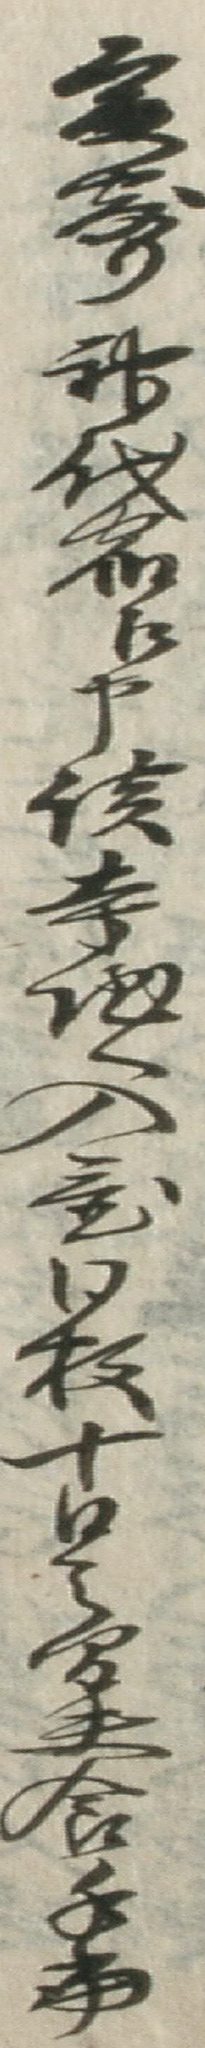最寄り神代宿江申談寺地へ入置日数十日之間夫食手当
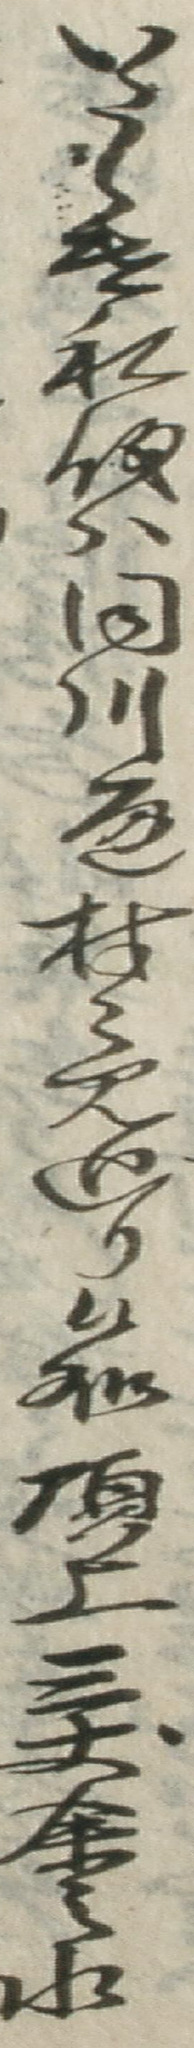いたし遣私儀ハ同川通近村々見廻り候処頂上三丈余之水
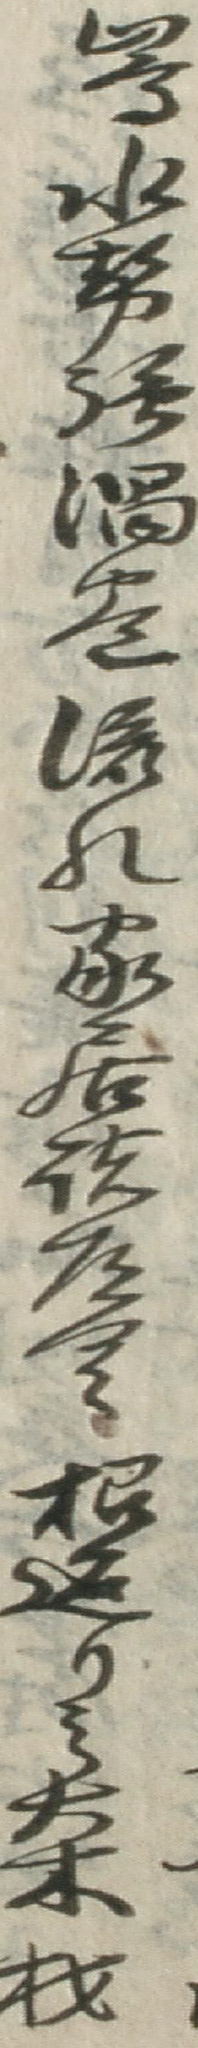嵩水勢強渦巻流れ家居諸道具根返り之大木材
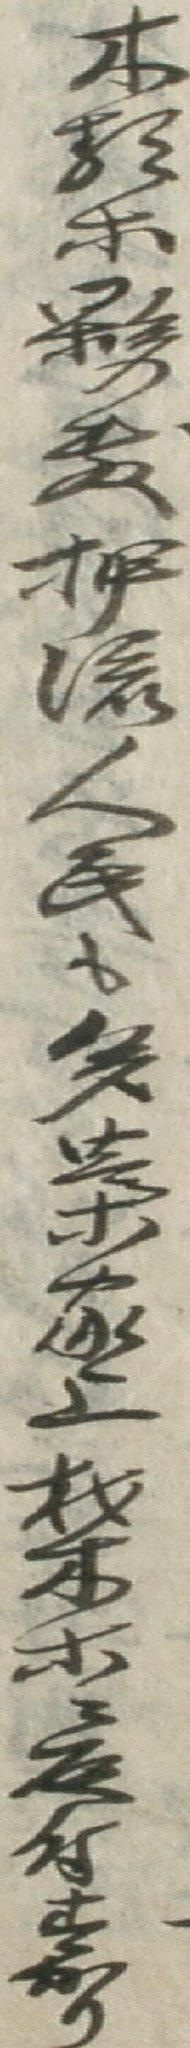木類等夥敷押流人民も多藁家上材木等二取付すかり
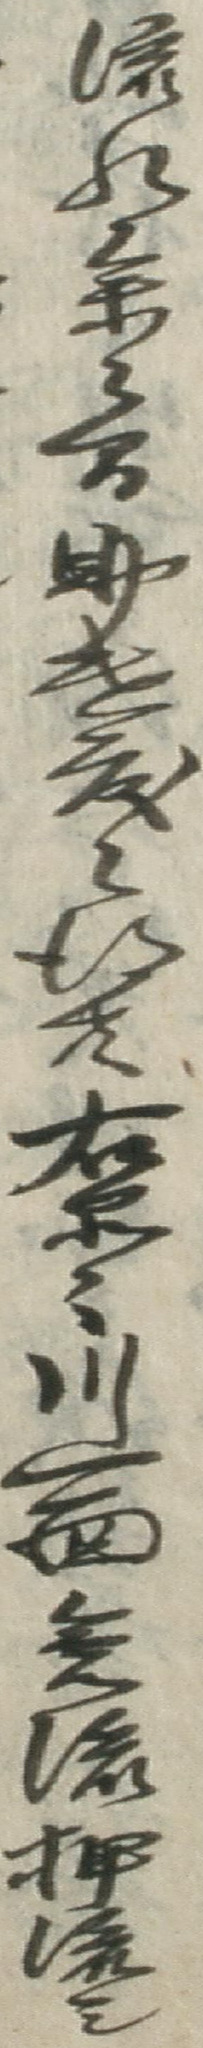流れ参候間助遣度候得共右品々川一面急流押流ㇱ
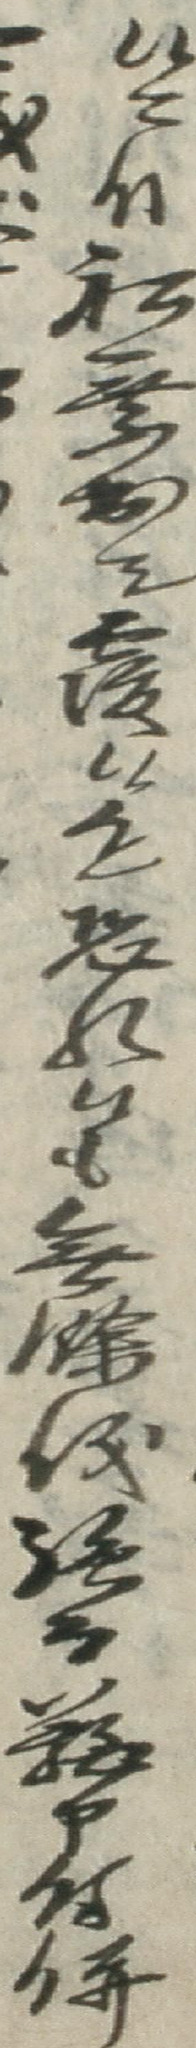候二付船乗出ㇱ覆候を恐れ候も無餘儀強而難申付併
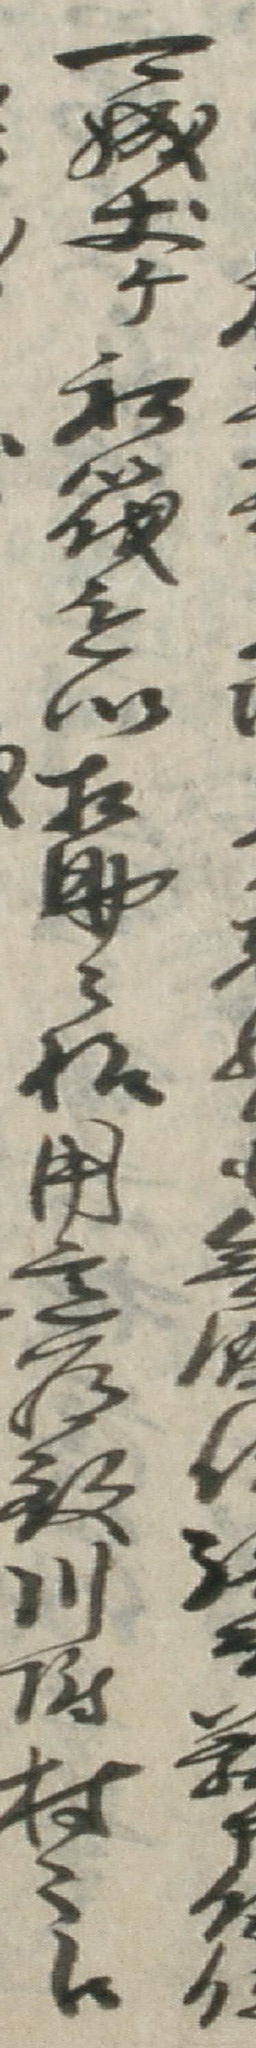可成丈ヶ船筏を以相助候様用意為致川附村々江
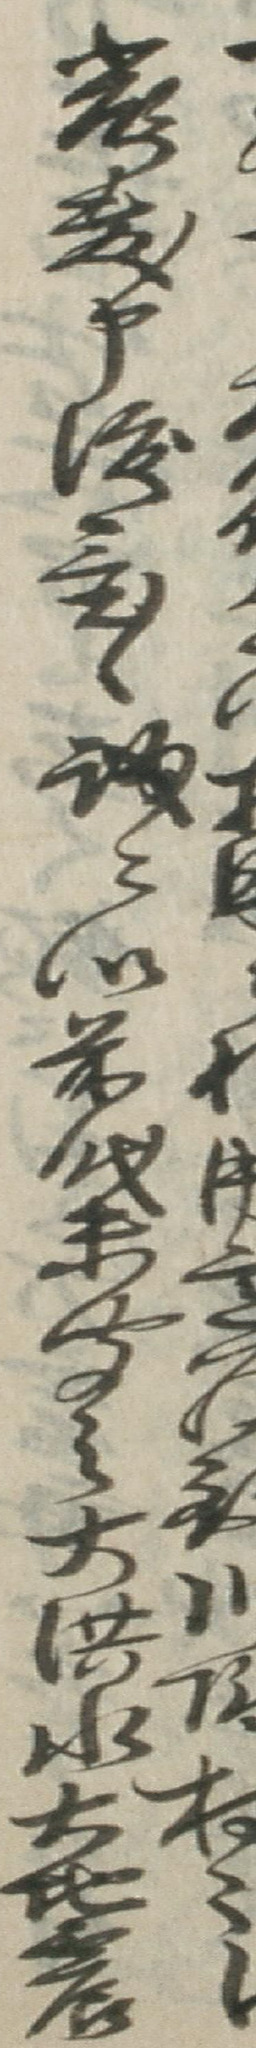厳敷申渡置候誠二以前代未聞之大洪水大地震
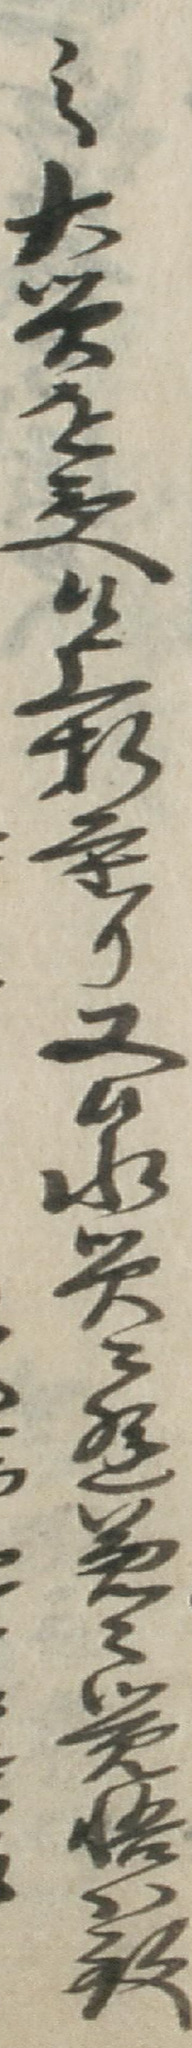之大災を受候上折重り又候水災二逢兼々覚悟ハ致
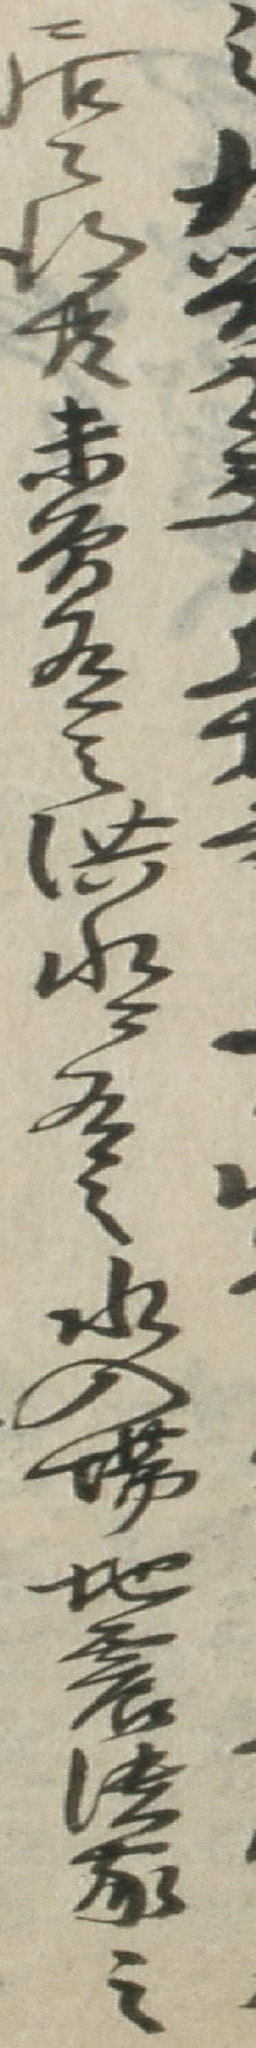居候得共未曾有之洪水二有之水入場地震潰家之
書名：信濃國地震實録記
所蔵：東京大学地震研究所図書室 Earthquake Research Institute Library, The University of Tokyo, JAPAN
